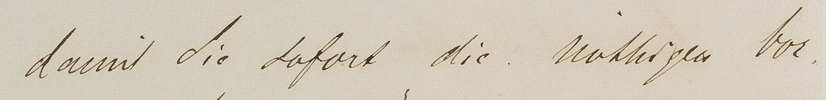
damit Sie sofort die nöthigen Vor-
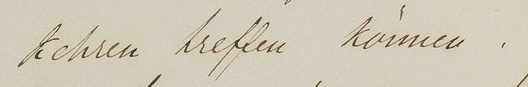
kehren treffen können.
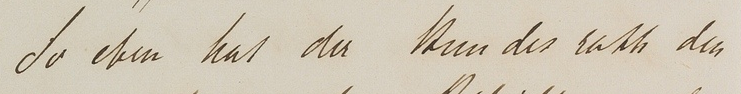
So eben hat der Bundesrath den
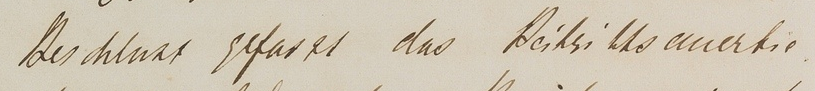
Beschluss gefasst das Beitrittsanerbie-
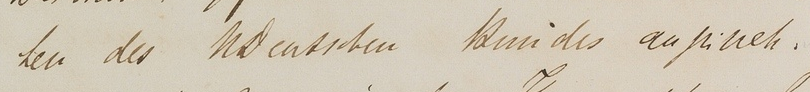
ten des NDeutschen Bundes anzuneh-
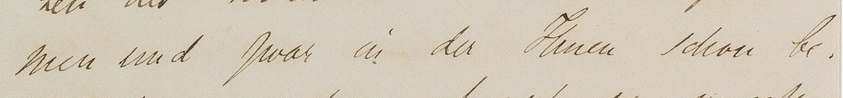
men und zwar in der Ihnen schon be-
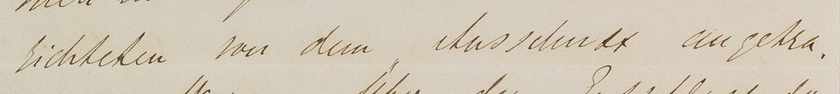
richteten von dem Ausschuss angetra-
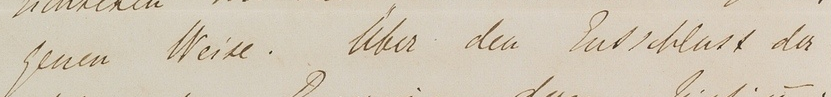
genen Weise. Über den Entschluss der
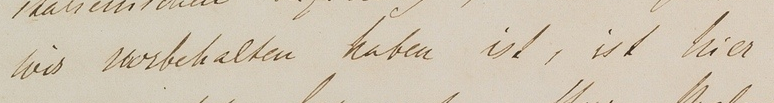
wir vorbehalten haben ist, ist hier
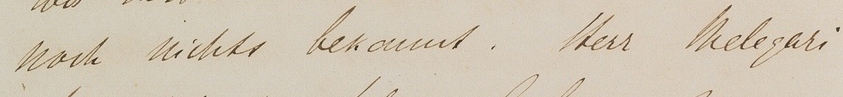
noch nichts bekannt. Herr Melegari
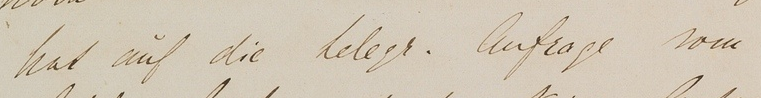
hat auf die telegr. Anfrage vom
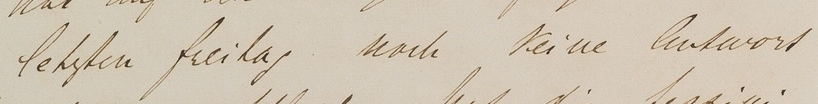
letzten Freitag noch keine Antwort
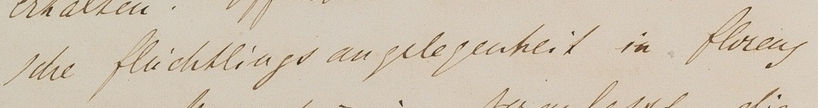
sche Flüchtlingsangelegenheit in Florenz
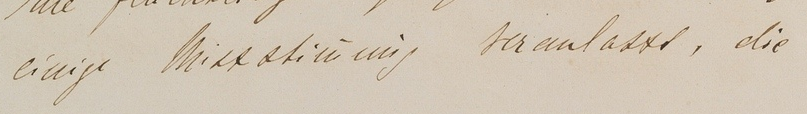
einige Missstimmung veranlasst, die
